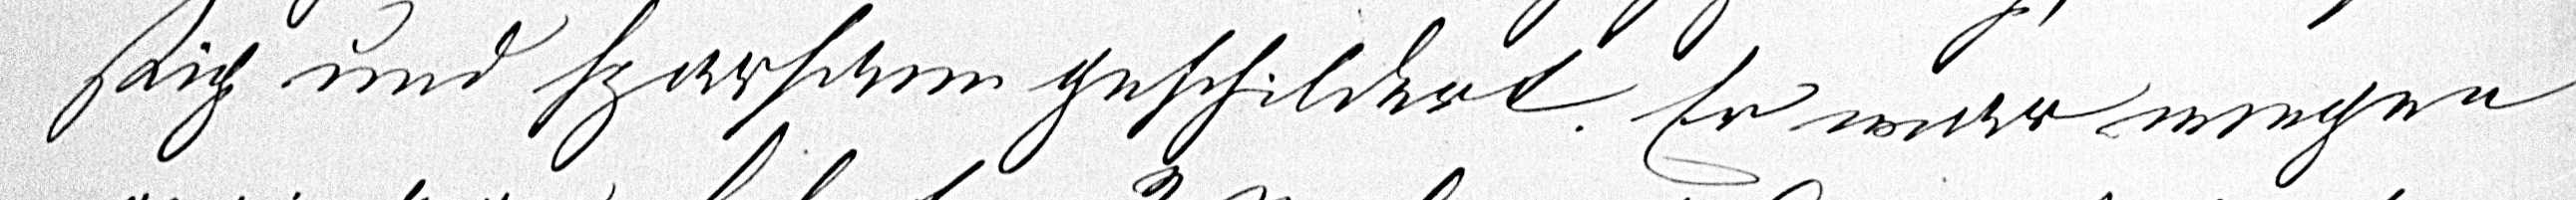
stig und sparxx geschildert. Er war wegen
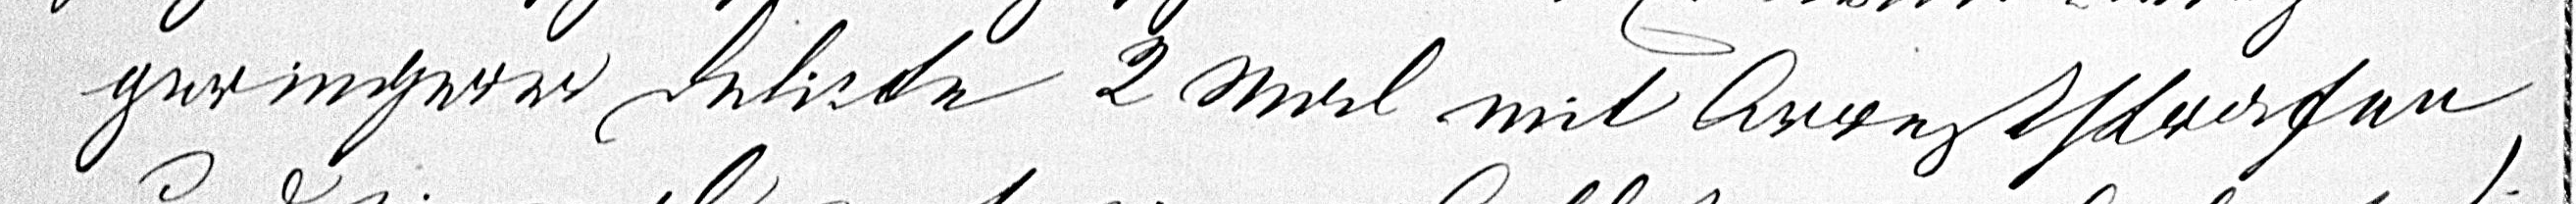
geringerer Delicte 2 Mal mit Arreststrafen
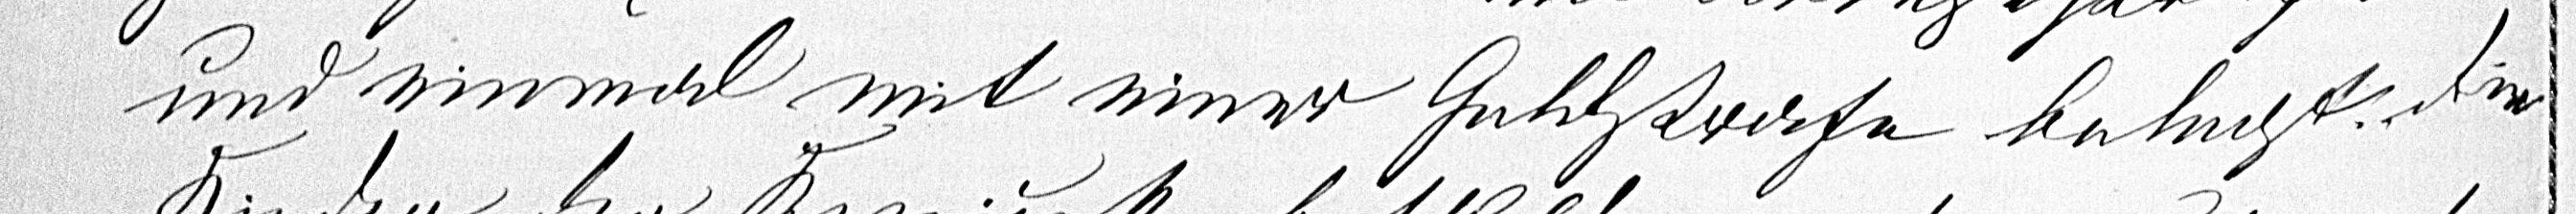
und einmal mit einer Gehlstrafe belegt. Der
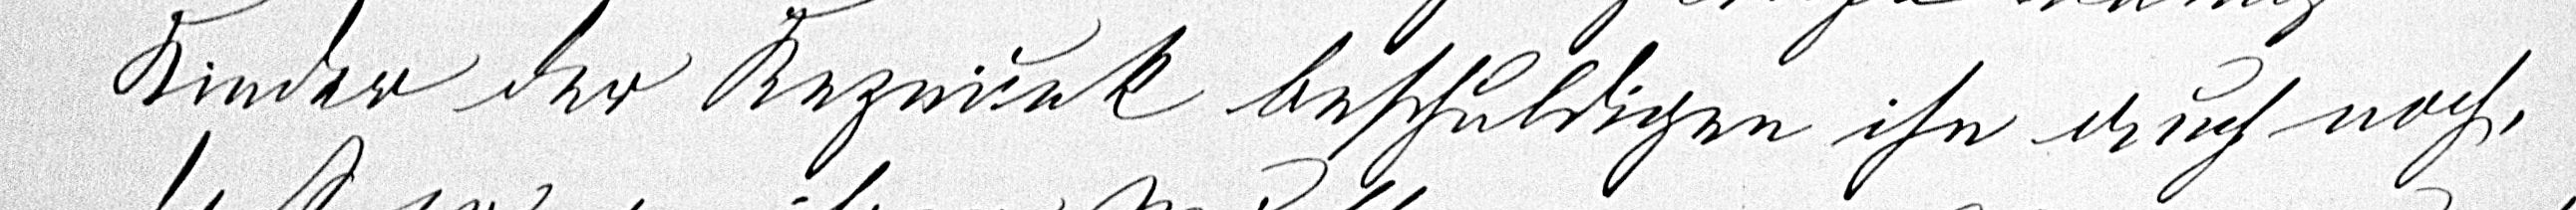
Kinder der Rezniček beschuldigen ihn durch noch,
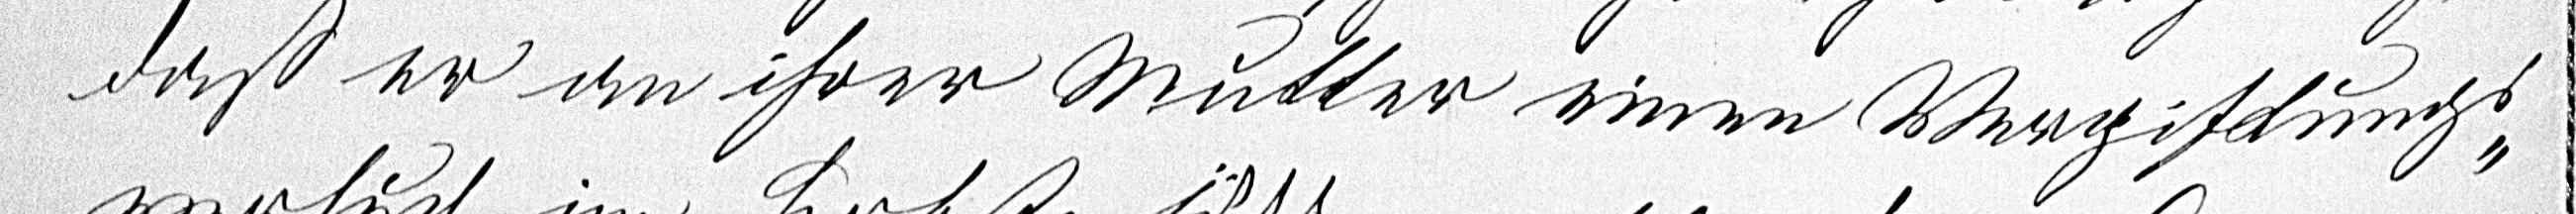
daß er an ihrer Mutter einen Vergiftungs¬
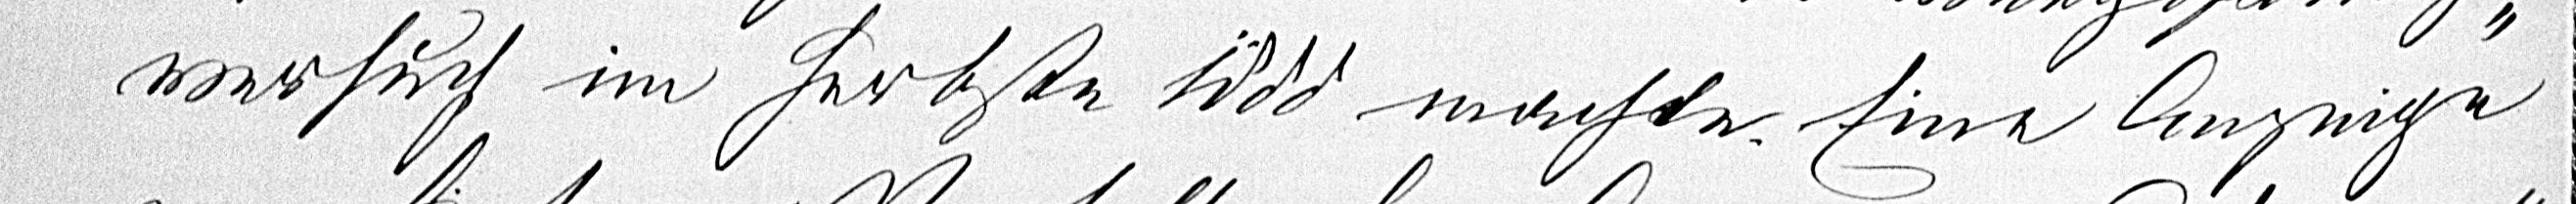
versuch im Herbste 1888 machte. Eine Anzeige
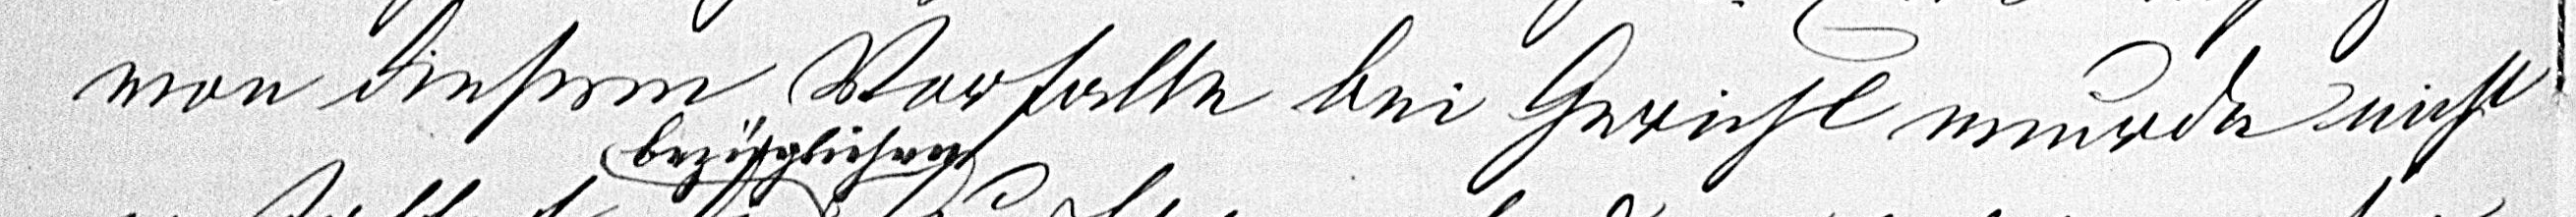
mon diesem Vorfalle bei Gericht wurde nicht
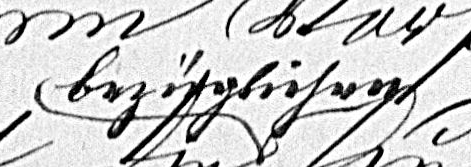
bezüglichen
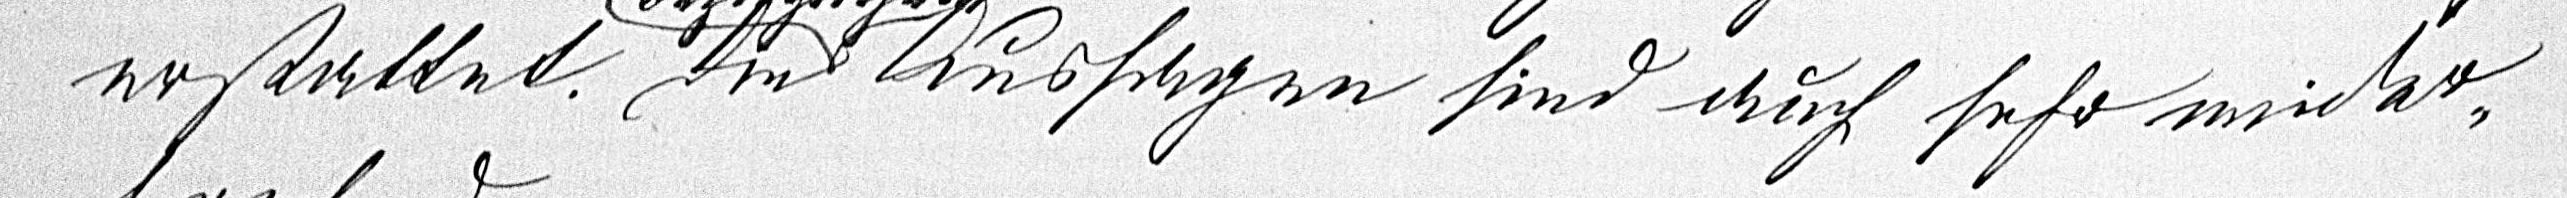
erstattet. Die Aussagen sind auch sehr wider¬
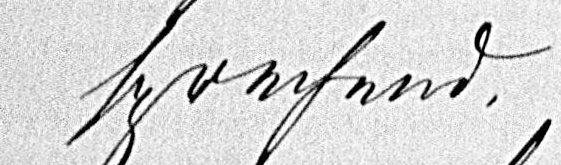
sprechend.
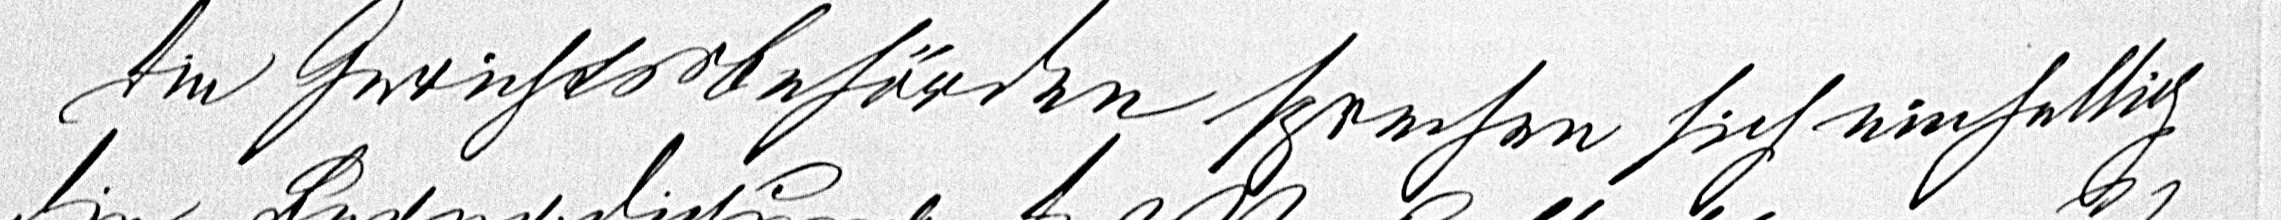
Die Gerichtsbehörden sprechen sich einhellig
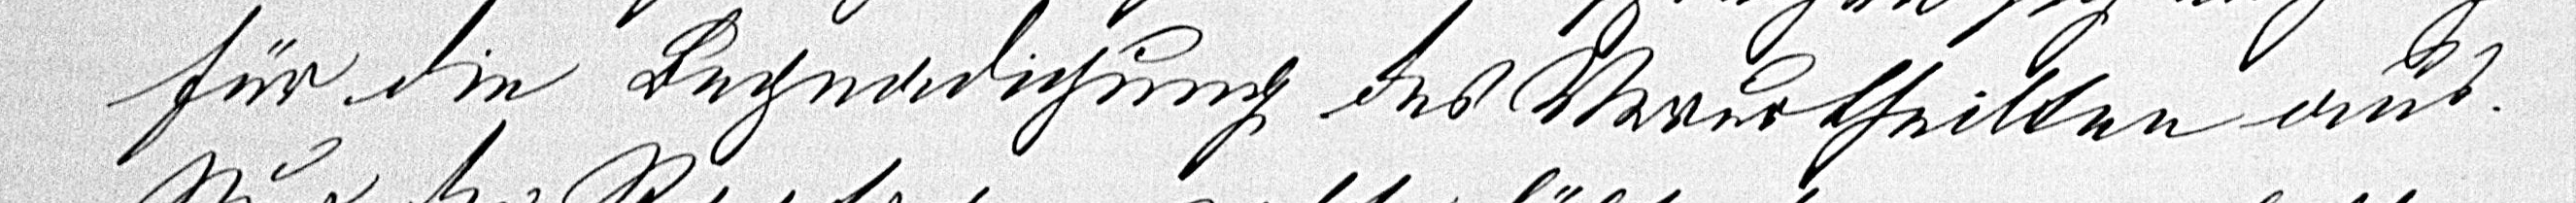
für die Begnadigung des Verurtheilten aus.
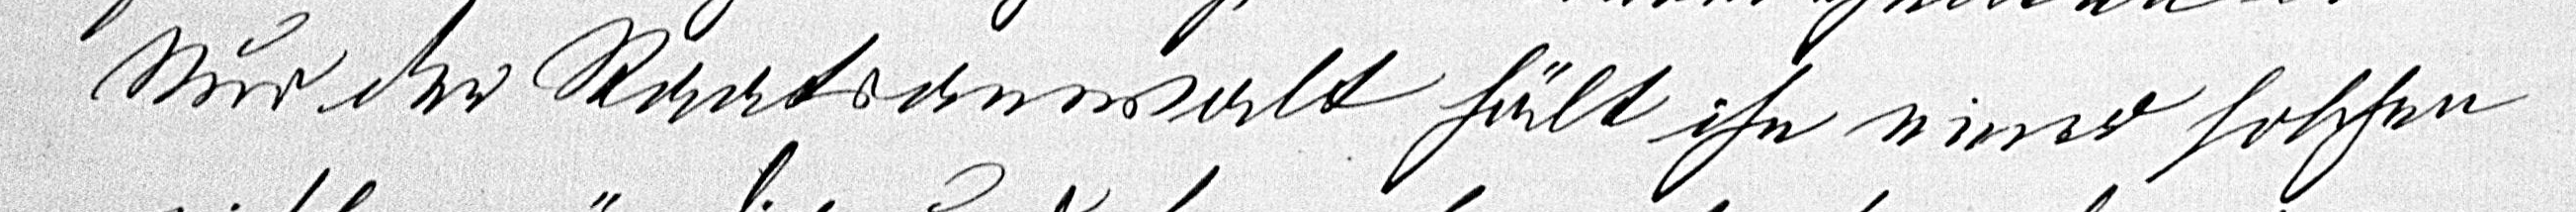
Nur der Staatsanwalt fält ihn einer solchen
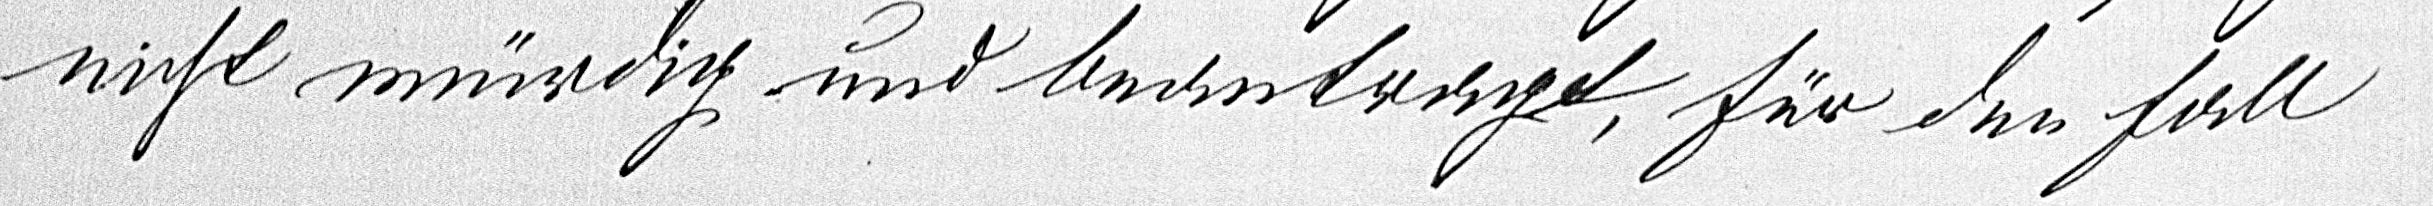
nicht würdig und beantragt, für den fall
